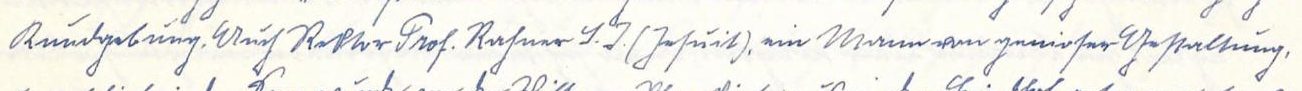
Kundgebung. Auch Rektor Prof. Rahner S.J. (Jesuit), ein Mann von genioser Gestaltung,
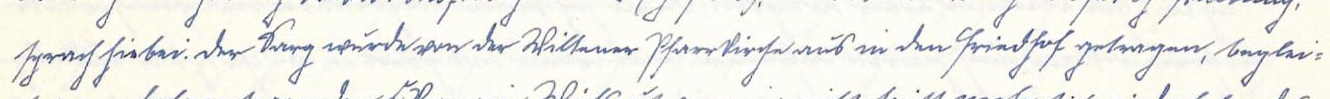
sprach hierbei. Der Sarg wurde von der Wiltener Pfarrkirche aus in den Friedhof getragen, beglei-
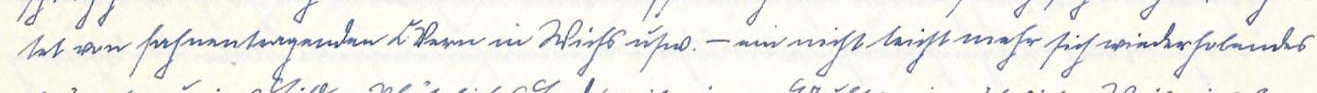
tet von fahnentragenden CVern in Wichs usw.- ein nicht leicht mehr sich wiederholendes
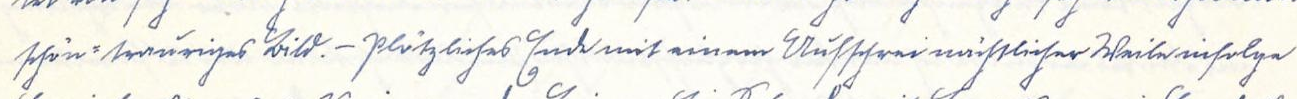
schön-trauriges Bild. Plötzliches Ende mit einem Aufschrei nächtlicher Weile infolge
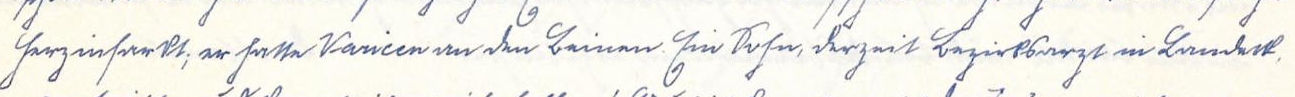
Herzinfarkt; er hatte Varicen an den Beinen. Ein Sohn, derzeit Bezirksarzt in Landeck,
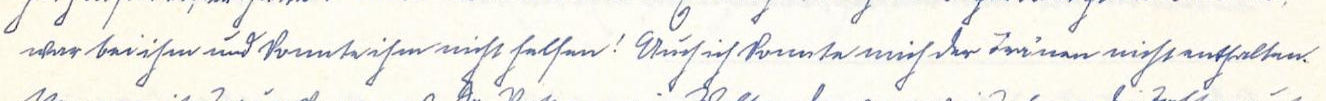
war bei ihm und konnte ihm nicht helfen! Auch ich konnte mich der Trauer nicht enthalten.
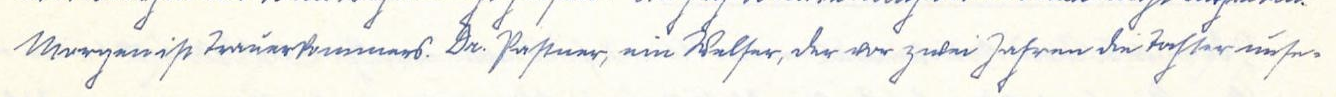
Morgen ist Trauerkommers. Dr. Pastner, ein Welser, der vor zwei Jahren die Tochter unse-
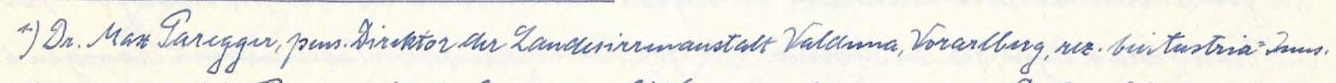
1) Dr. Max Parigger, pensionierter Direktor der Landesirrenanstalt Valduna, Vorarlberg, rez. bei Austria . Inns-
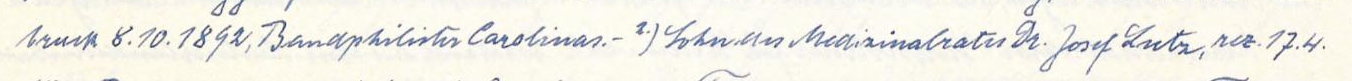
bruck 8.10.1892, Bandphilister der Carolina. 2) Sohn des Medizinalrates Dr. Josef Lutz, rez. 17.4.
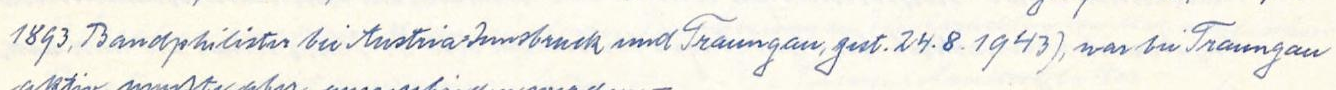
1893, Bandphilister bei Austrua Innsbruck und Traungau, gest. 20.8.1943) war bei Traungau
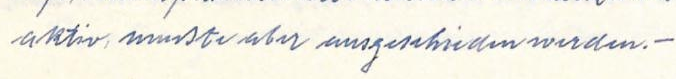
aktiv, mußte aber ausgeschieden werden.
